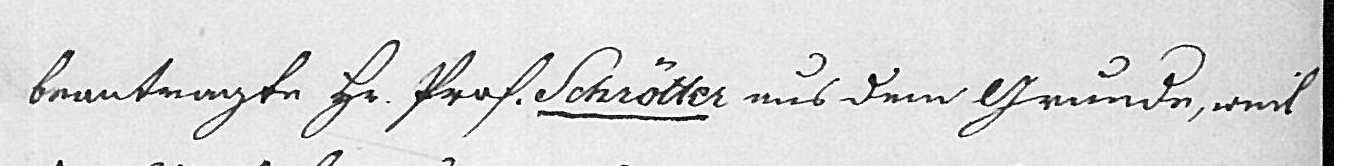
beantragte Hr. Prof. Schrötter aus dem Grunde, weil
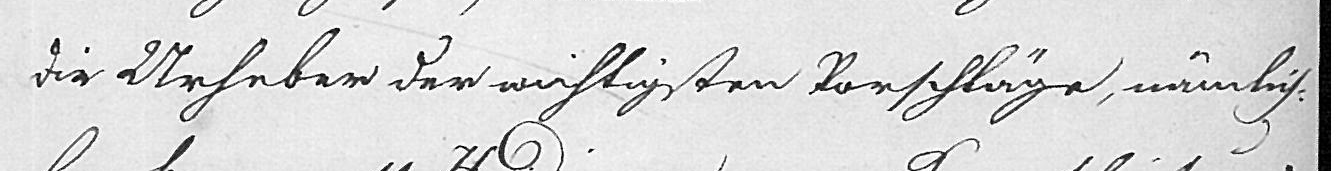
die Urheber der wichtigisten Vorschläge, nämlich
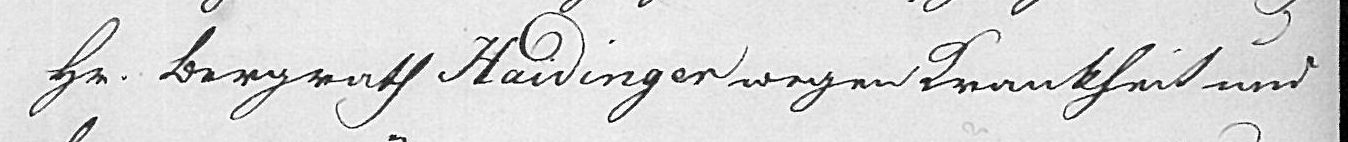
Hr. Bergrath Haidinger wegen Krankheit und
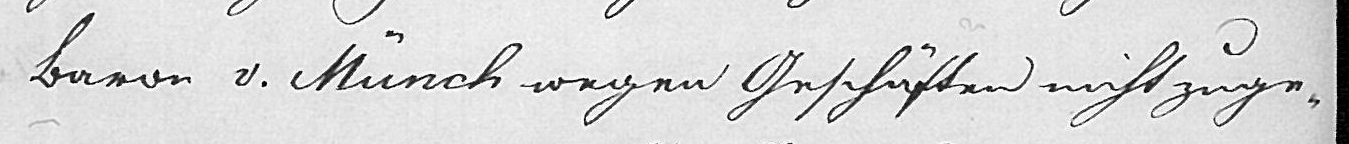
Baron v. Münch wegen Geschäften nicht zuge-
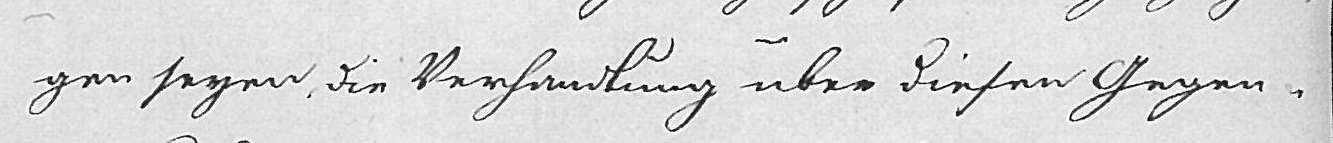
gen seyen, die Verhandlung über diesen Gegen-
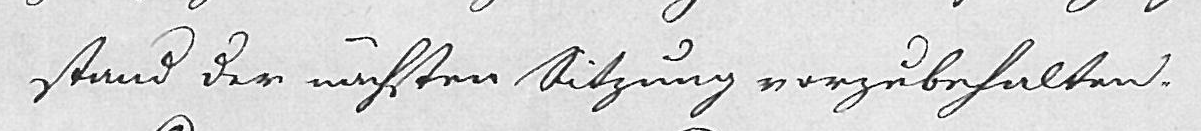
stand der nächsten Sitzung vorzubehalten.
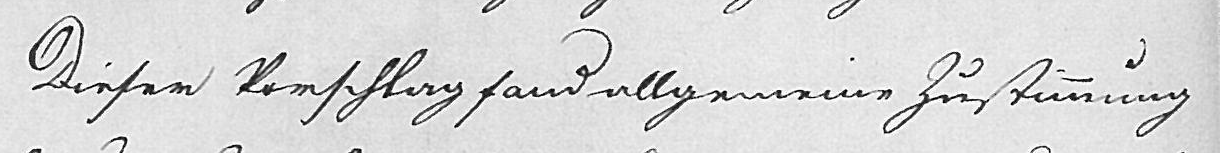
Dieser Vorschlag fand allgemeine Zustimmung
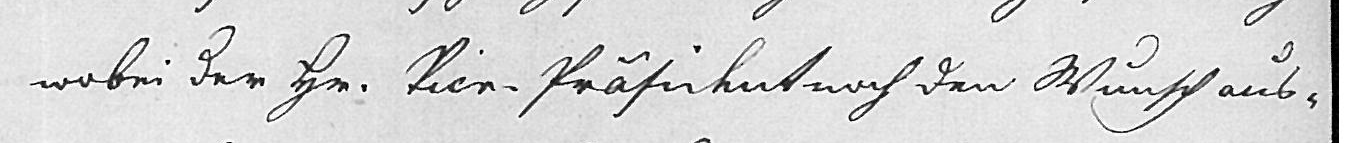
wobei der Hr. Vice-Präsident noch den Wunsch aus-
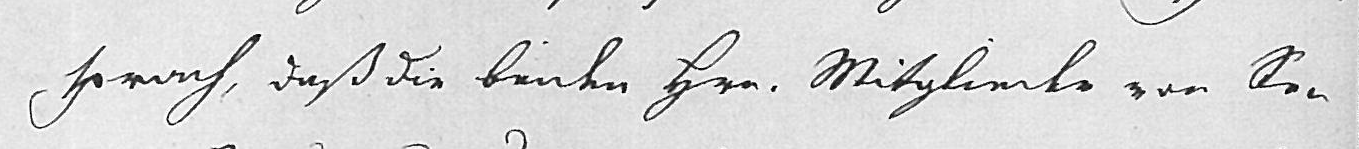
sprach, daß die beiden Hrn. Mitglieder von Se-
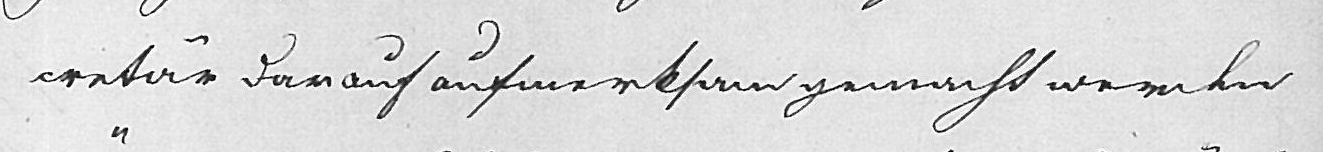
cretär darauf aunfmerksaun gemacht werden
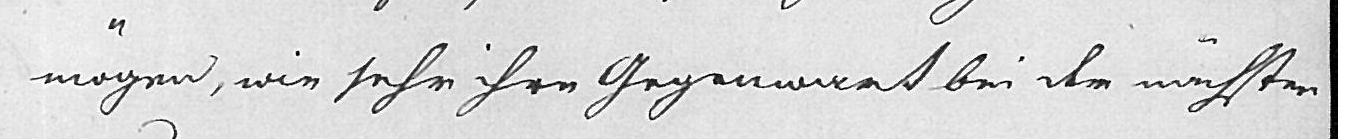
mögen, wie sehr ihre Gegenwart bei der nächsten
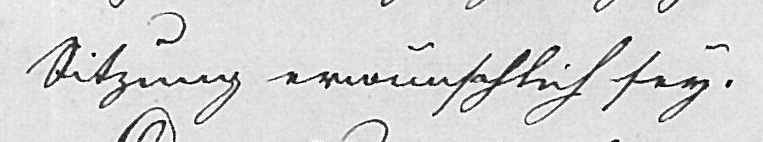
Sitzung erwünschlich sey.
